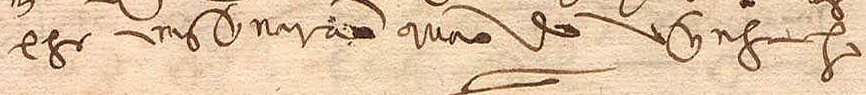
lhe emsynaraõ quãodo vynha ho
